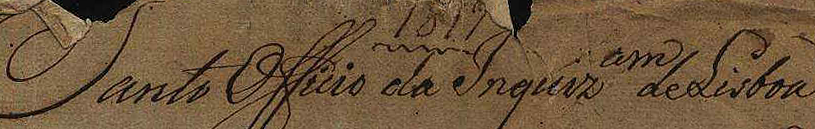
Santo Officio da Inquizam de Lisboa
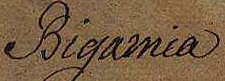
Bigamia
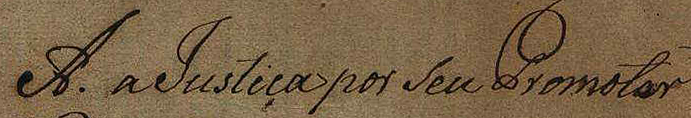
A. a Iustiça por seu Promotor
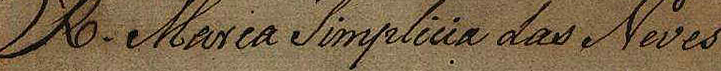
R. Maria Simplicia das Neves
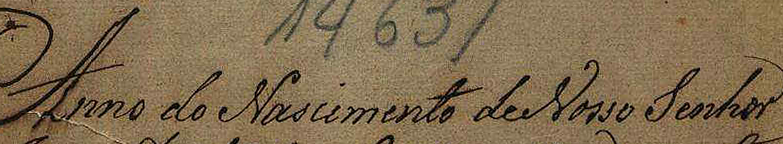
Anno do Nascimento de Nosso Senhor
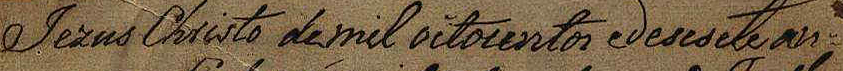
Iezus Christo de mil oitocentos e desesete an
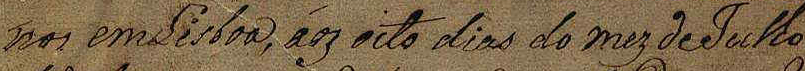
nos em Lisboa, áoz oito dias do mez de Iulho
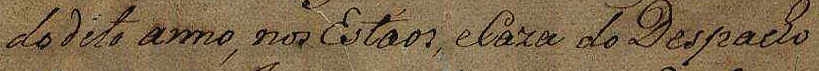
do dito anno, nos Estáos, e Caza do Despacho
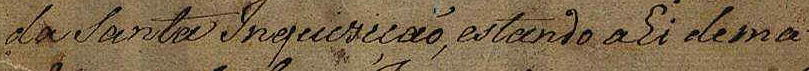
da Santa Inquizição, estando ahi de ma
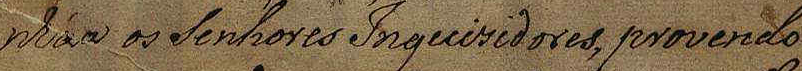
nhãa os Senhores Inquizidores, provendo
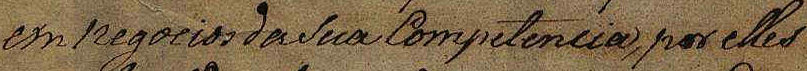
em negosios da sua competencia, por elles
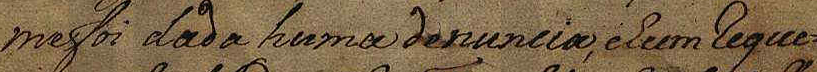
me foi dada huma denuncia, e hum Reque
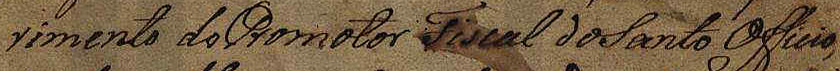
rimento do Promotor Fiscal do Santo Officio,
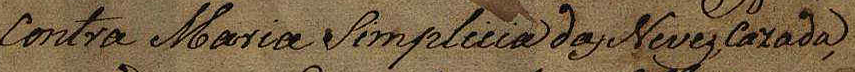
contra Maria Simplicia das Neves, cazada,
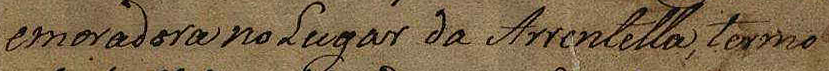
e moradora no Lugar da Arrentella, termo
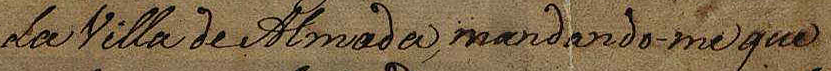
da Villa de Almada, mandando-me que
